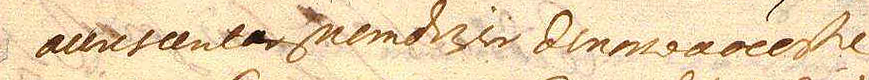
accrescentar nem dizer de nouo ao cost.e
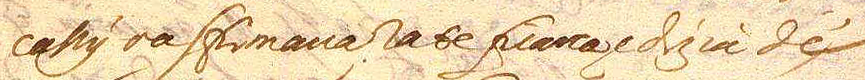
e assy o affirmaua rateficaua, e dizia de
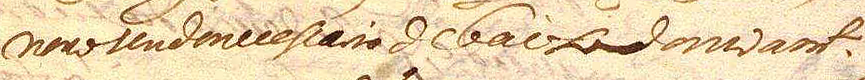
nouo sendo necessario debaixo do iuramto.
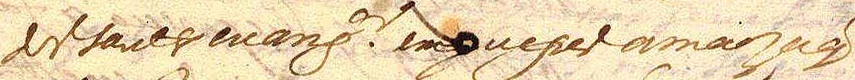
dos santos euang.os em que pos a maõ a q̄
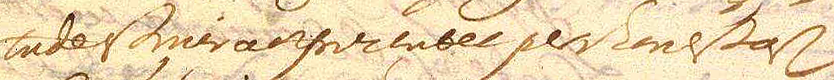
tudo estiueraõ prezentes per honestas
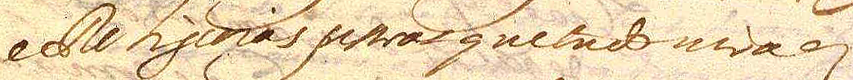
e Relijiozas pessoas que tudo uiraõ
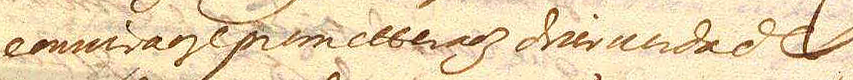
e ouuiraõ e prometteraõ dizer uerdade
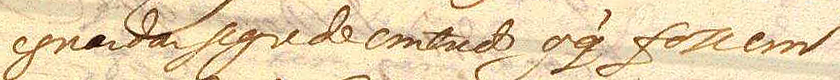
e guardar segredo em tudo o q̄ fossem
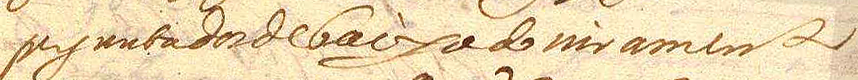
perguntadas debaixo do iuramento
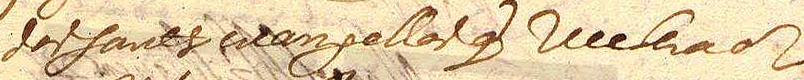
dos santos euangelhos q̄ Receberaõ
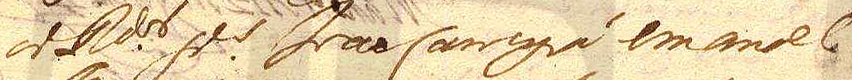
os R.dos sres. Joao Carreyra, e manoel
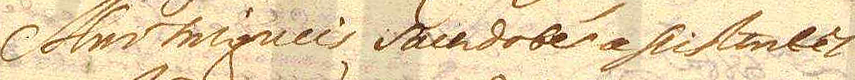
Aluz̄ migueis, Sacerdotes assistentes
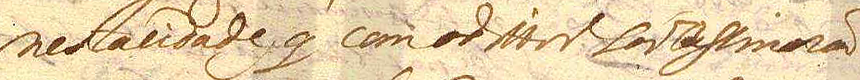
nesta cidade, q̄ com o ditto sor assinaraõ
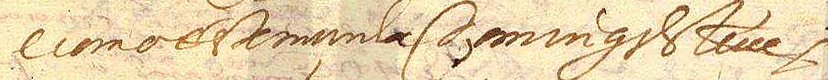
e com a testemunha Dominḡs Esteues
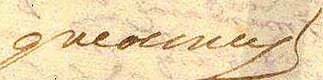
que o screuj
